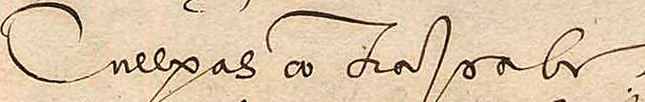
Cullpas cōtra Jsabel
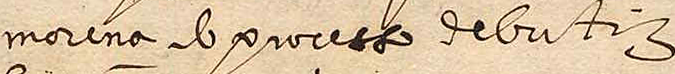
morena do proçesso de britiz
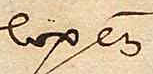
lopez̄
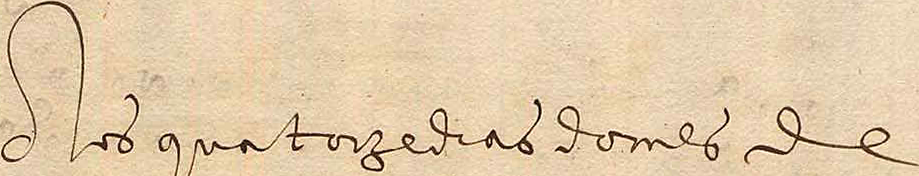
Aos quatorze dias do mes de
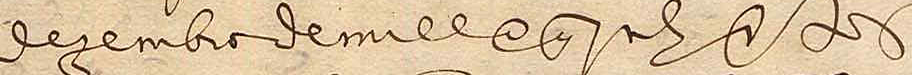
dezembro de mill e q̄jnhētos
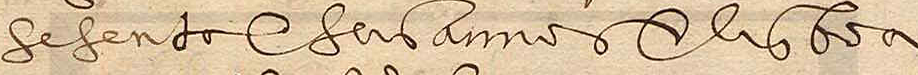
sesenta e seis annos ē lisboa
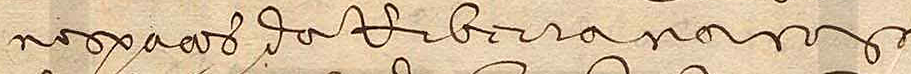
nos paços da Ribeira na casa
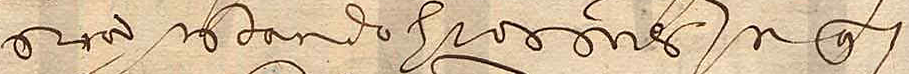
sição estando hi os s̄ores jnq̄y
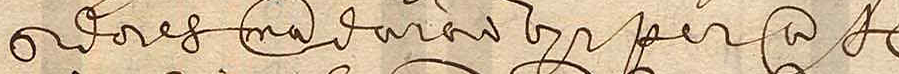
sidores mādarão vjr perāte
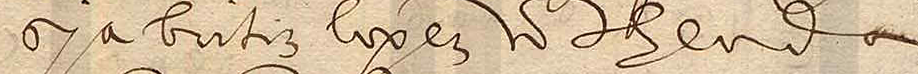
sj a britiz lopez cōtheuda
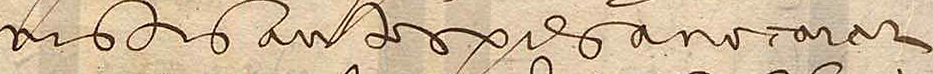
nestes autos presa no carcer
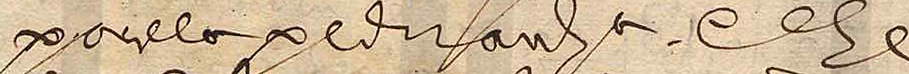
por ella pedir audja . e lhe
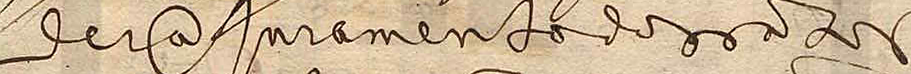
derā Juramento dos sātos
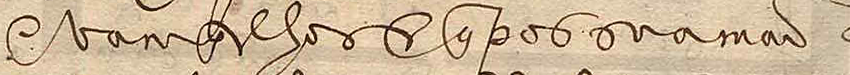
evamgelhos ē q̄ pos sua mão E
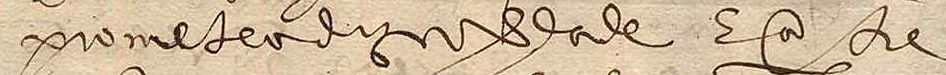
prometeo dizer ꝟdade E ātre
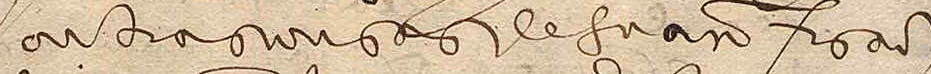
outras cousas de sua cōfisaõ
